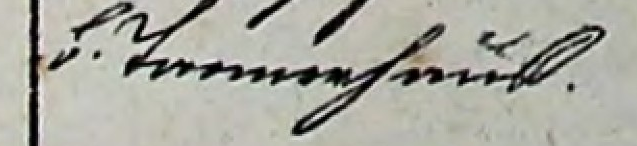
v. Tannerhaus
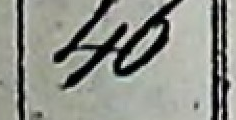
46
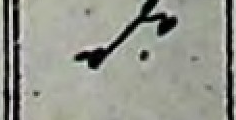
do
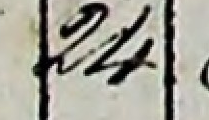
24
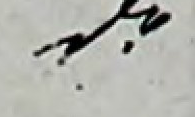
do
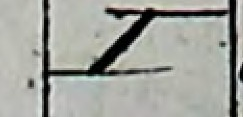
I
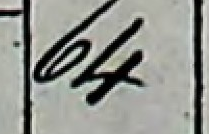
64
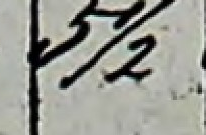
5 1/2
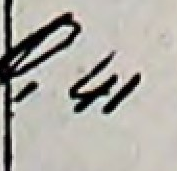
0,41
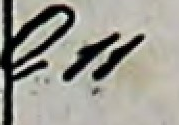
0,11
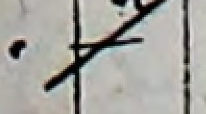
7
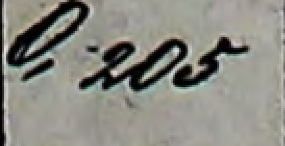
0,205
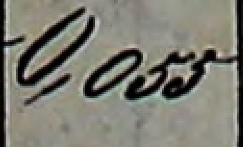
0,055
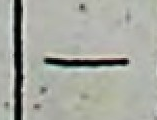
—
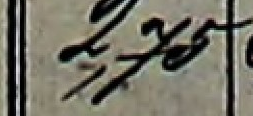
2,75
